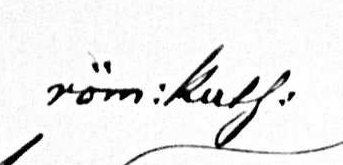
röm: kath:
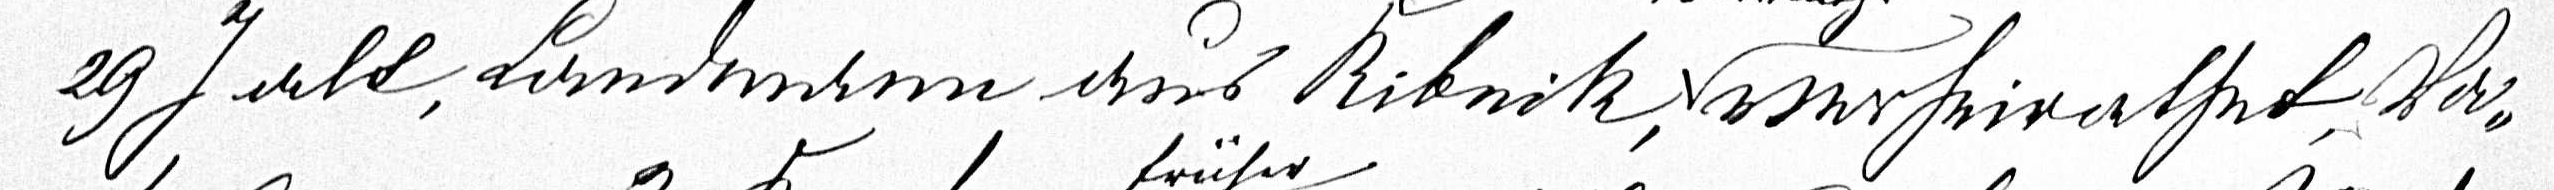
29 J alt, Landmann aus Ribnik, verheirathet, Va¬
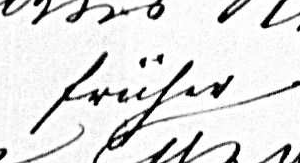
früher
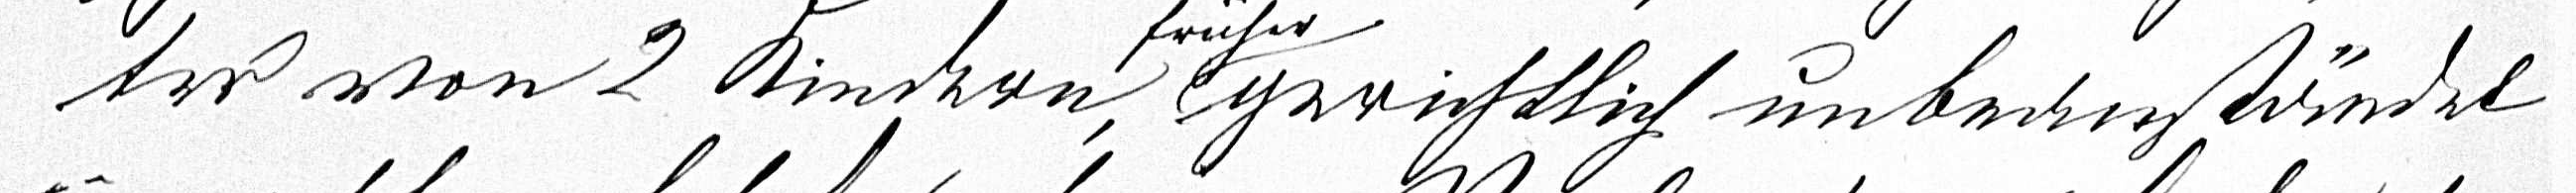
ter von 2 Kindern, gerichtlich unbeanständet
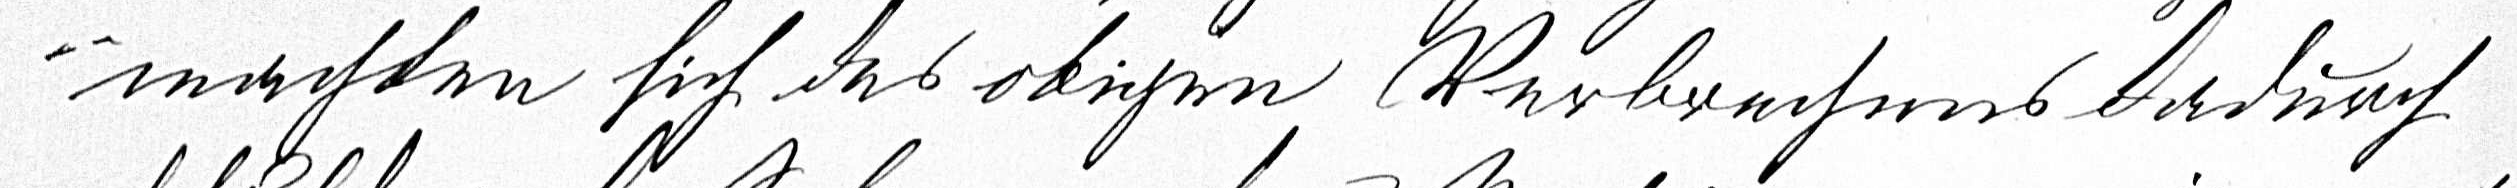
machten sich des obigen Verbrechens dadurch
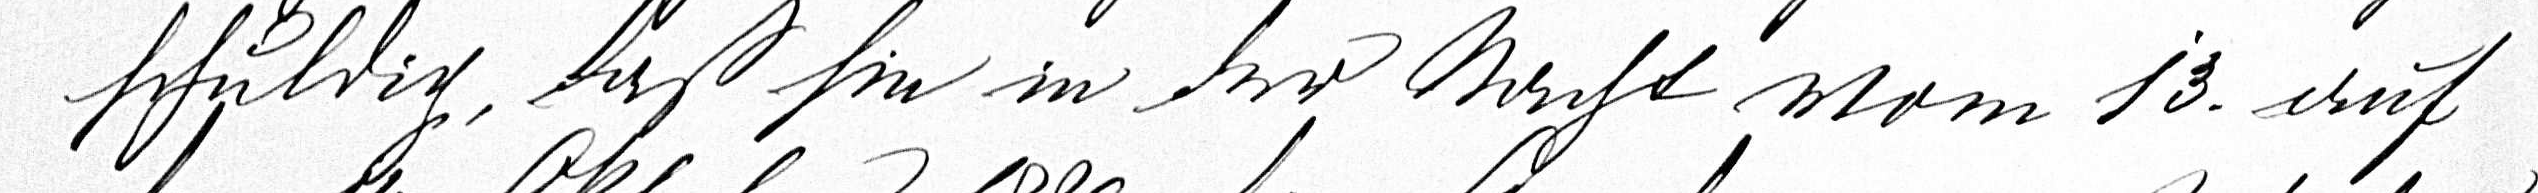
schuldig, daß hin in der Nacht vom 13. auf
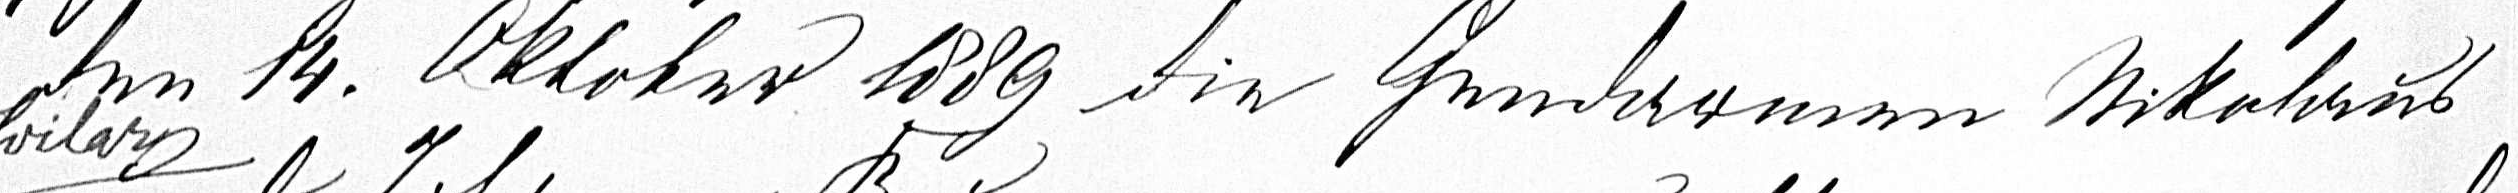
den 14. Oktober 1889 die Gendarmen Nikolaus
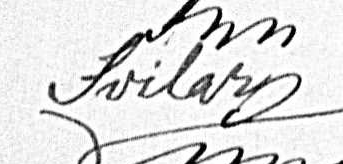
Svilar
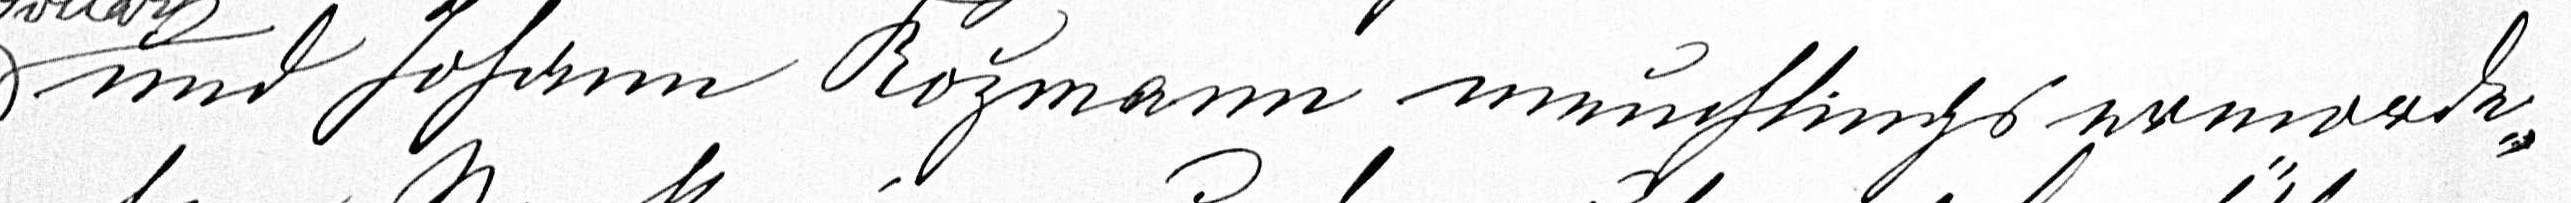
und Johann Rozmann meuchlings ermorde¬
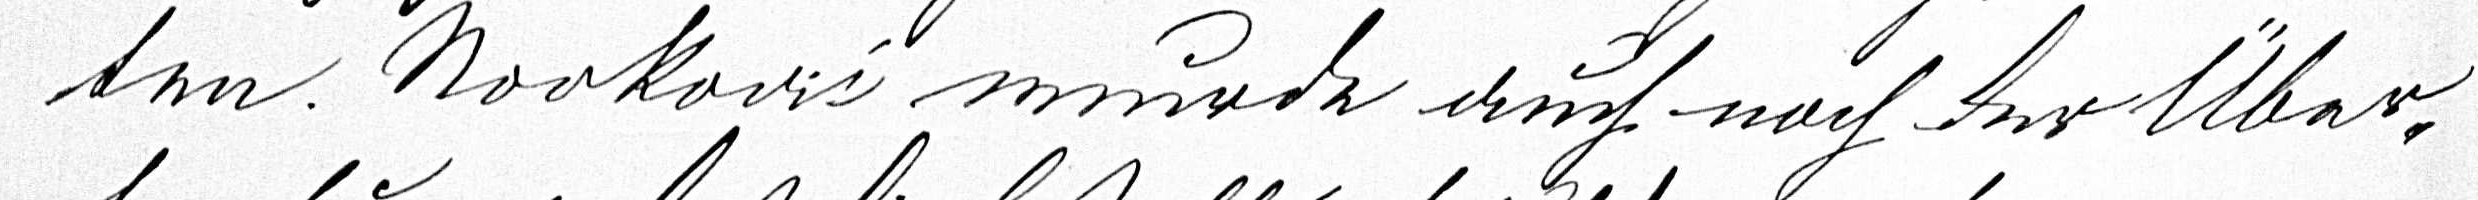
ten. Novković wurde auch nach der Über¬
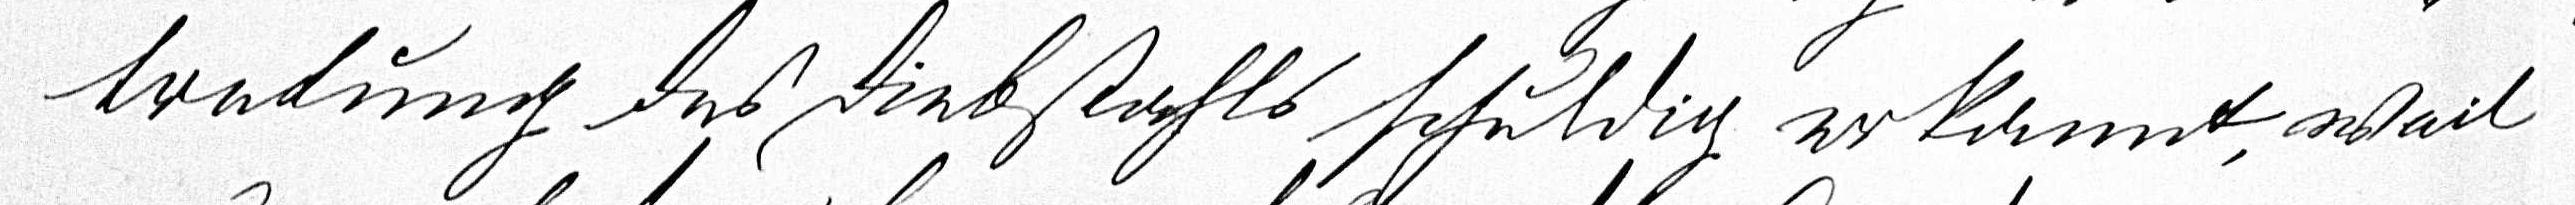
tretung des Diebstahls schuldig erkannt, weil
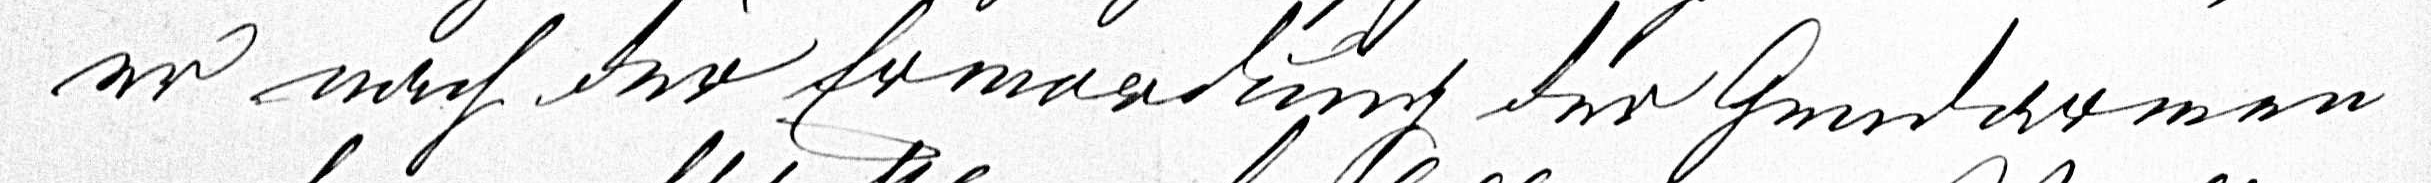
er nach der Ermordung der Gendarmen
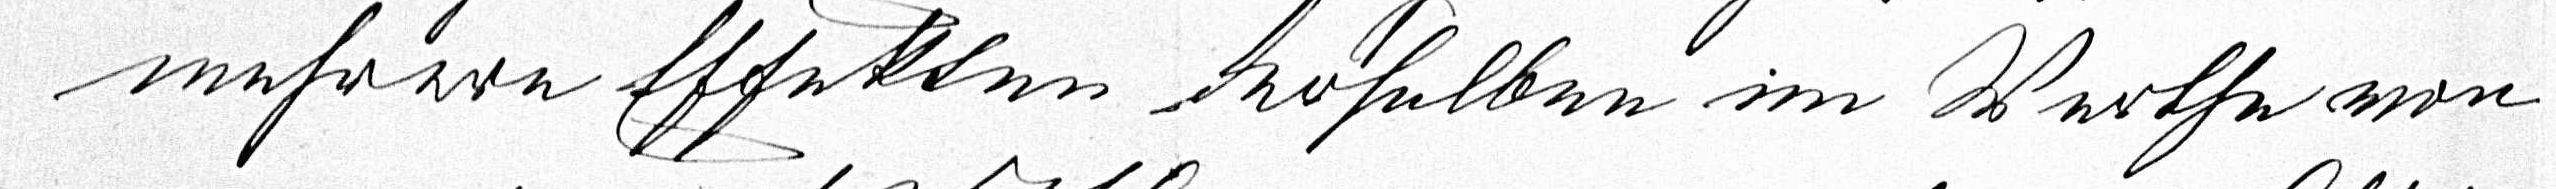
mehrere Effekten derselben im Verthe von
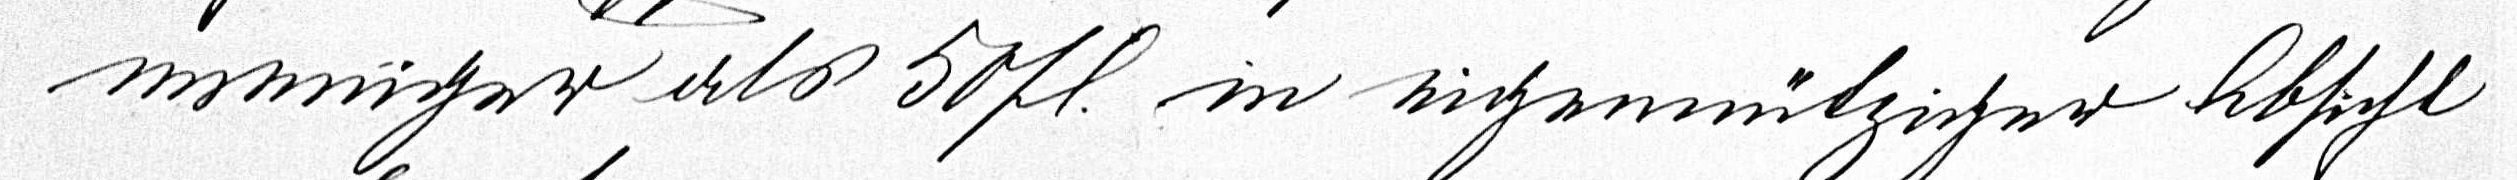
weniger als 50 fl. in eigenmütziger Absicht
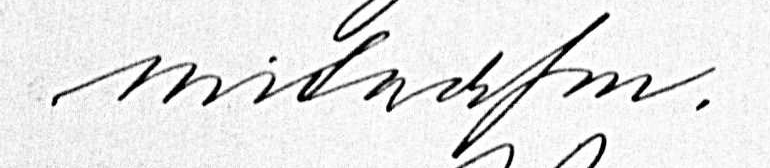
mitnahm.
